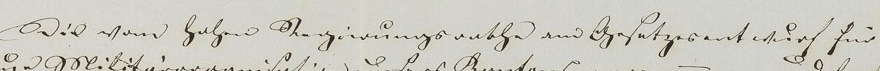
Die vom hohen Regierungsrathe am Gesetzesentwurf für
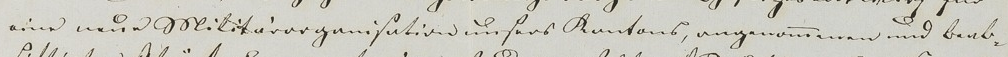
eine neue Militärorganisation unsers Kantons, angenommenen und beab-
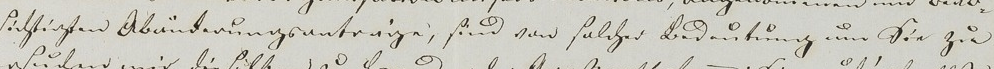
sichtigten Abänderungsanträge, sind von solcher Bedeutung um Sie zu
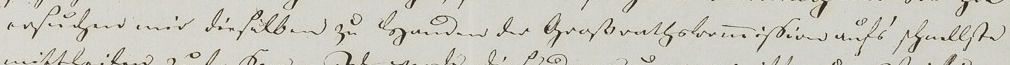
ersuchen mir dieselben zu Handen der Großrathskommission aufs' schnellste
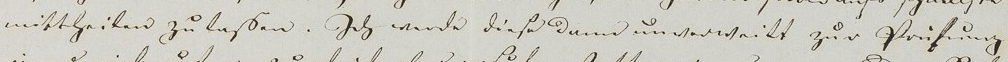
mittheilen zu lassen. Ich werde diese dann unverweilt zur Prüfung
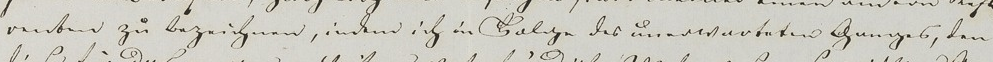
renten zu bezeichnen, indem ich in Folge des unerwarteten Ganges, den
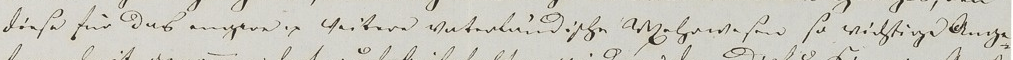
diese für das engere & weitere vaterländische Wehrwesen so wichtige Ange-
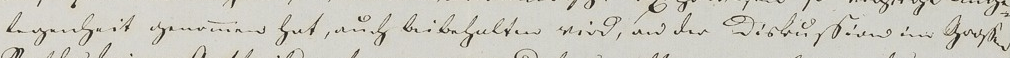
legenheit genommen hat, auch bei behalten wird, an der Diskussion im Grossen
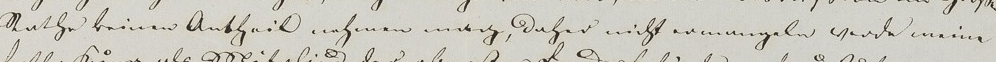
Rathe keinen Antheil nehmen mag, daher nicht ermangeln werde meine
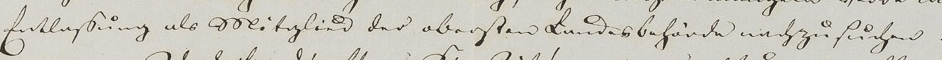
Entlassung als Mitglied der obersten Landesbehörde nachzusuchen.
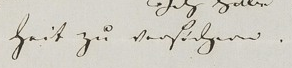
heit zu versichern.
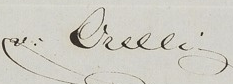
v. Orelli
